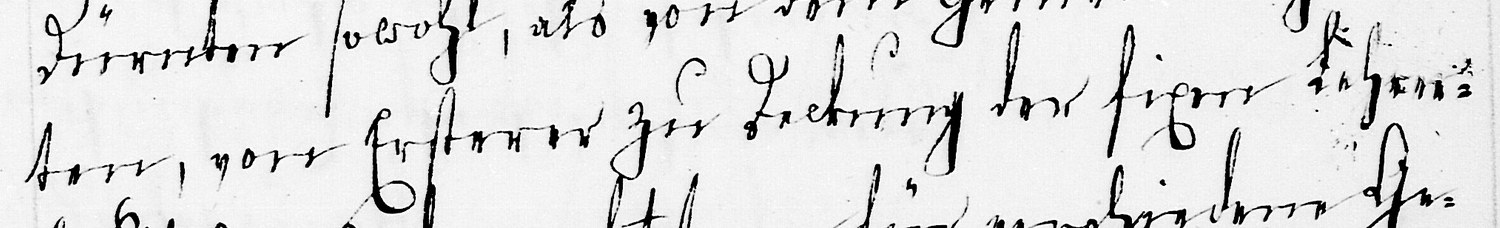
ten, von Ersterer zu Deckung der fixen Lehrer¬
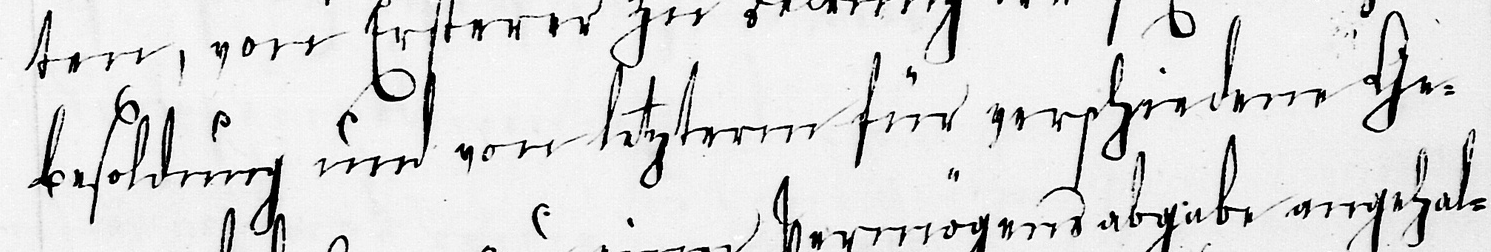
besoldung und von letzterm für verschiedene Ge¬
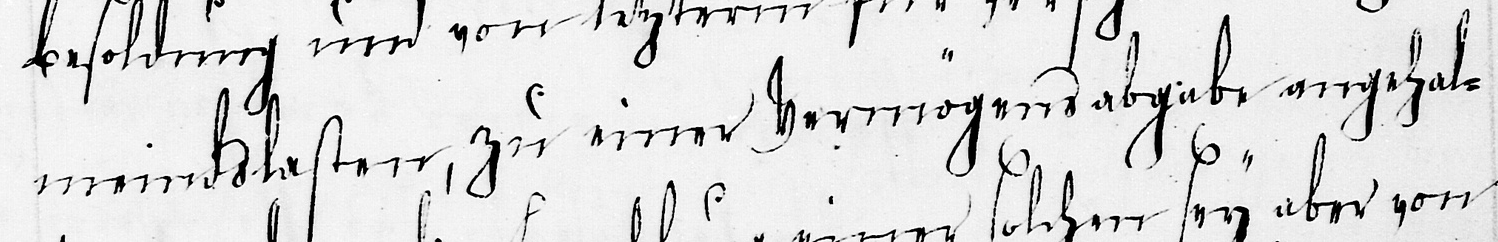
meindslasten, zu einer Vermögensabgabe angehal¬
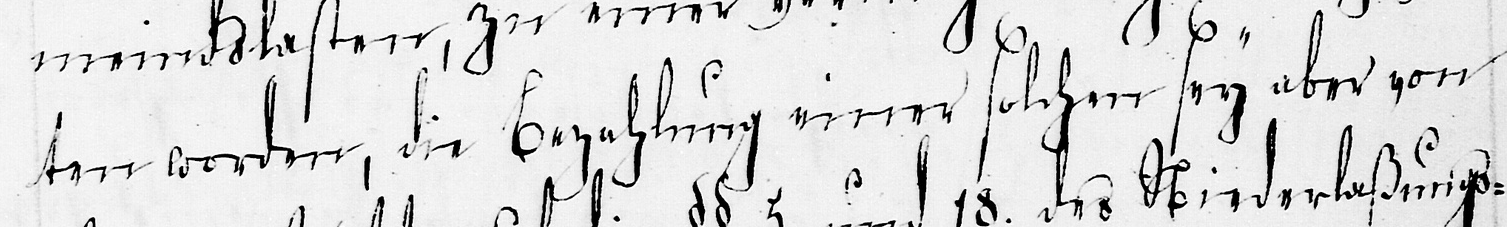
ten worden, die Bezahlung einer solchen sey aber von
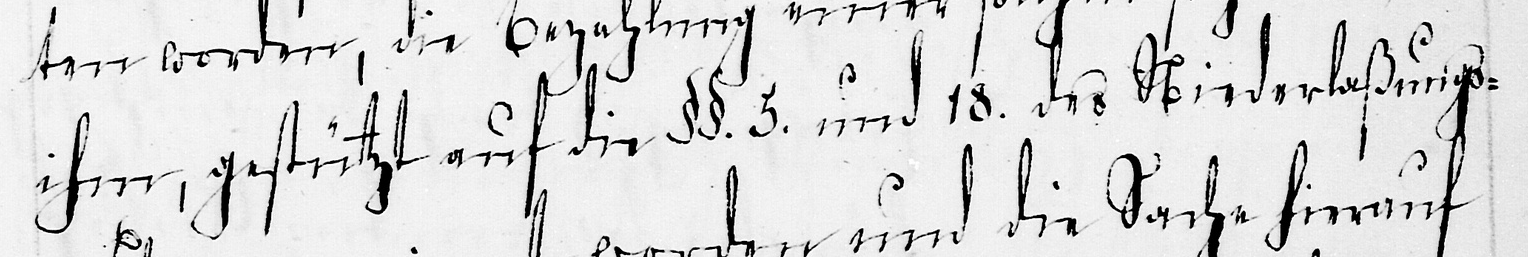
ihm, gestützt auf die §§. 5. und 18. des Niederlaßungs¬
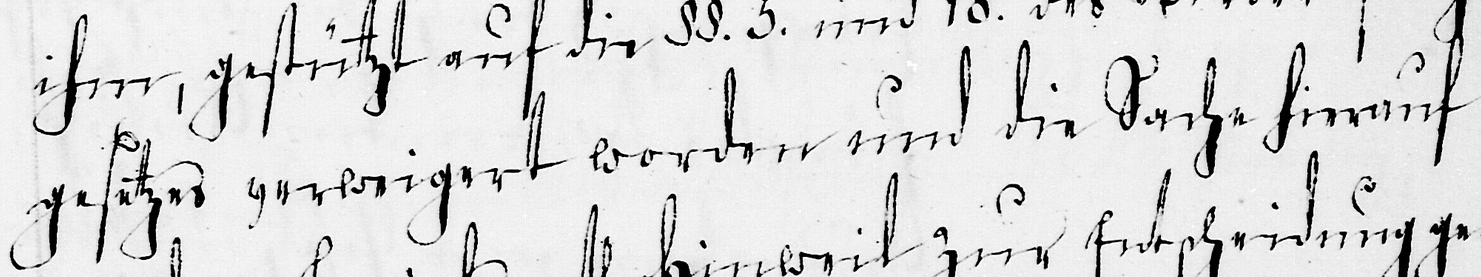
gesetzes verweigert worden und die Sache hierauf
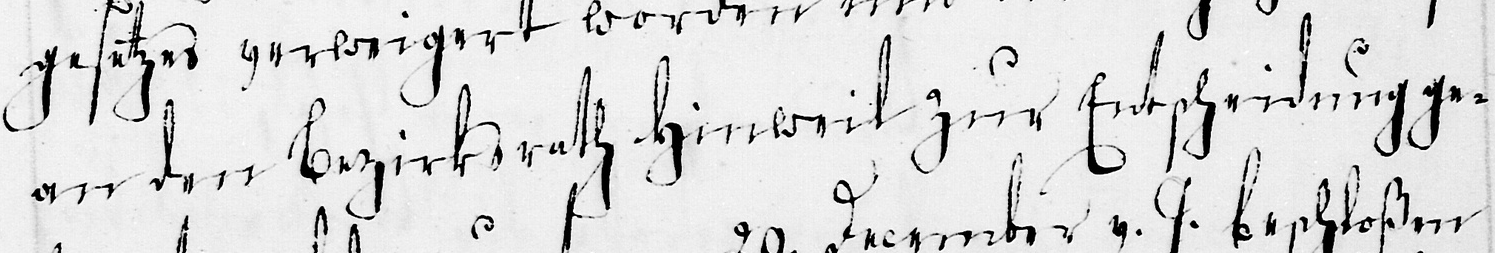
an den Bezirksrath Hinweil zur Entscheidung ge¬
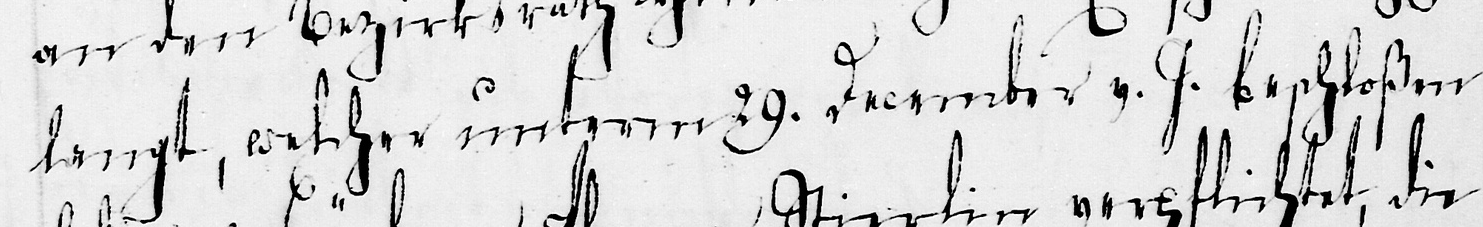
langt, welcher unterm 29. December v. J. beschloßen
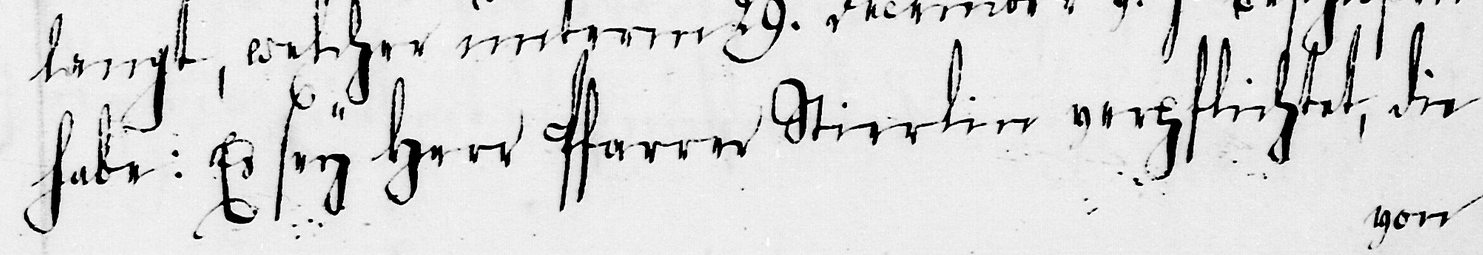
habe: Es sey Herr Pfarrer Stierlin verpflichtet, d¬
